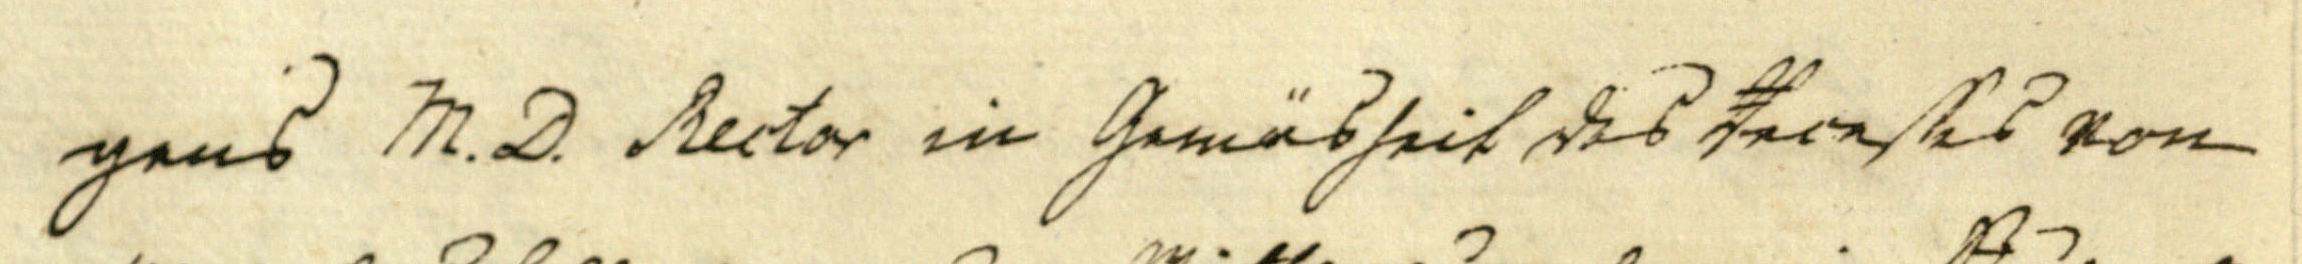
gens M. D. Rector in Gemäsheit des Recesses von
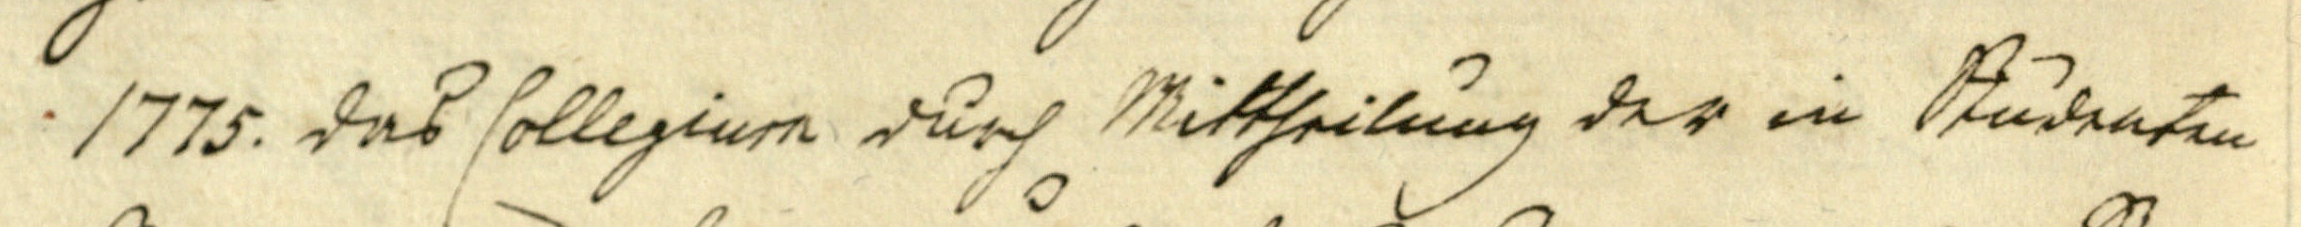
1775. das Collegium durch Mittheilung der in Studenten
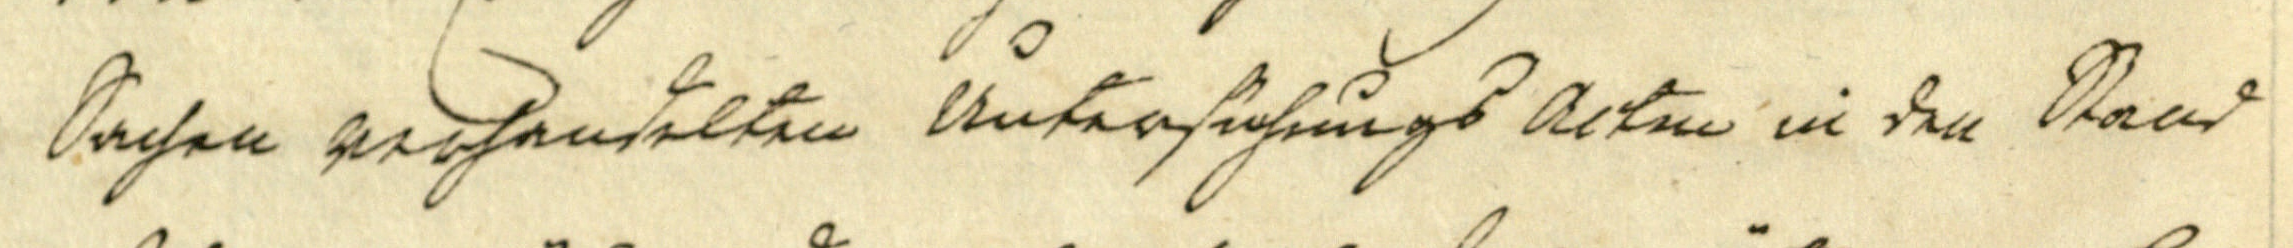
Sachen verhandelten Untersuchungs Acten in den Stand
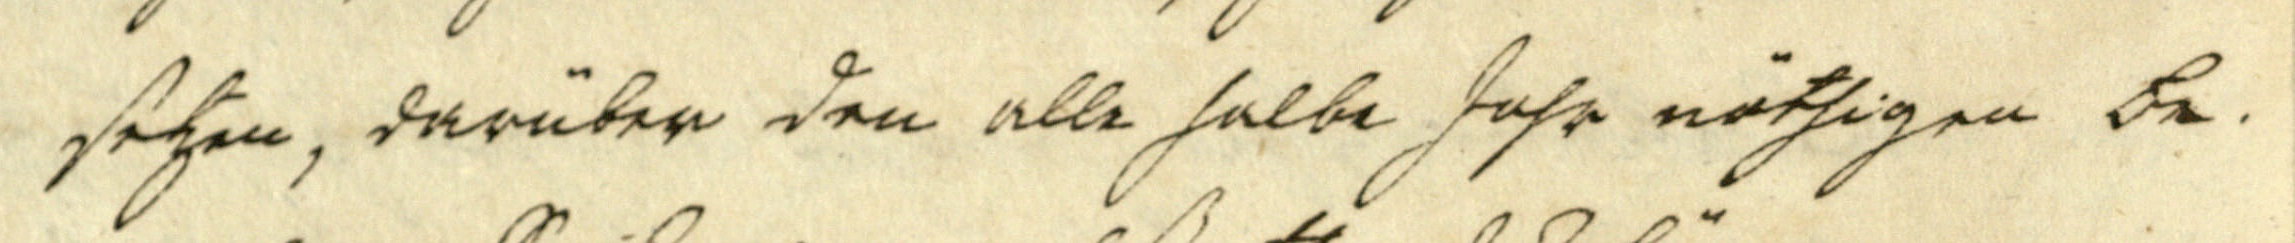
setzen, darüber den alle halbe Jahr nöthigen Be¬
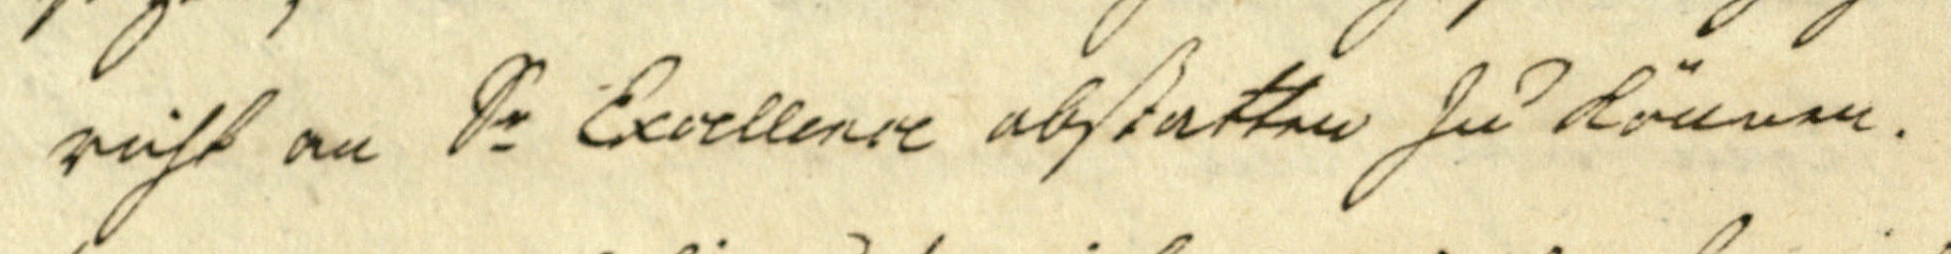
richt an Sr Excellence abstatten zu können.
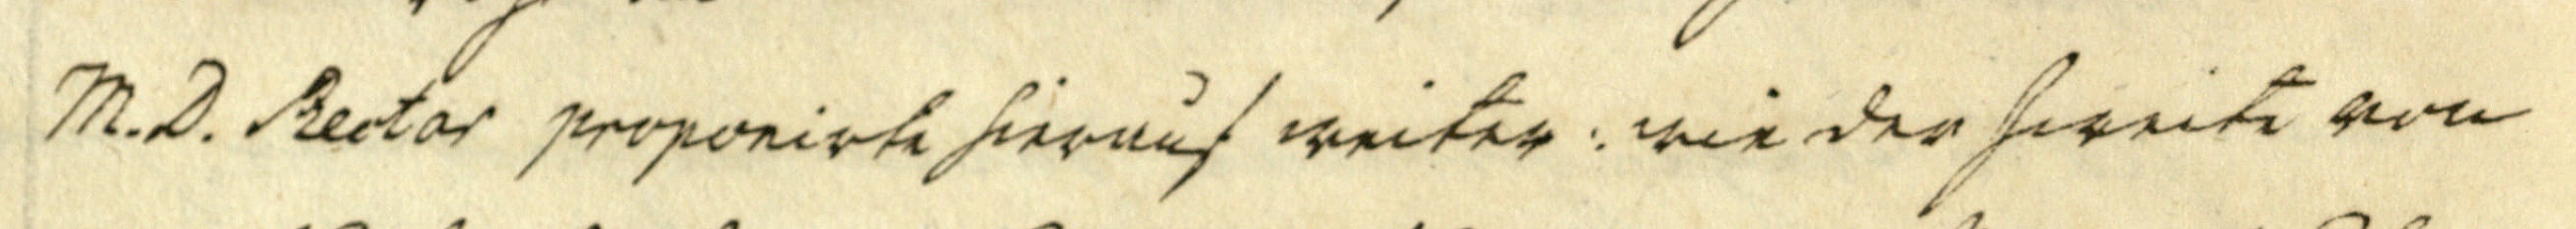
M. D. Rector proponirte hierauf weiter: wie der zweite von
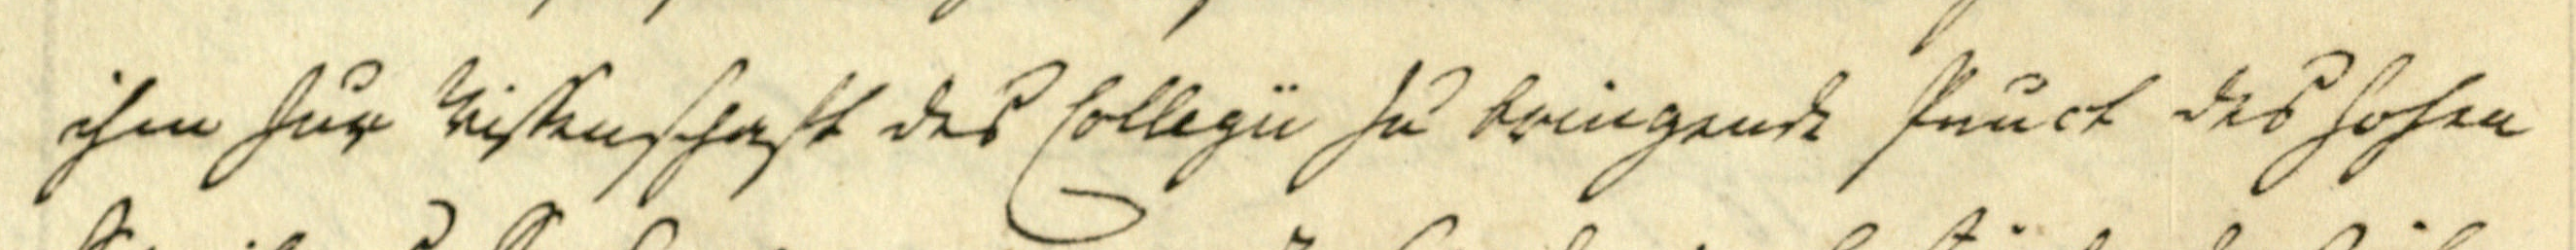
ihm zur Wissenschaft des Collegio zu bringende Punct des hohen
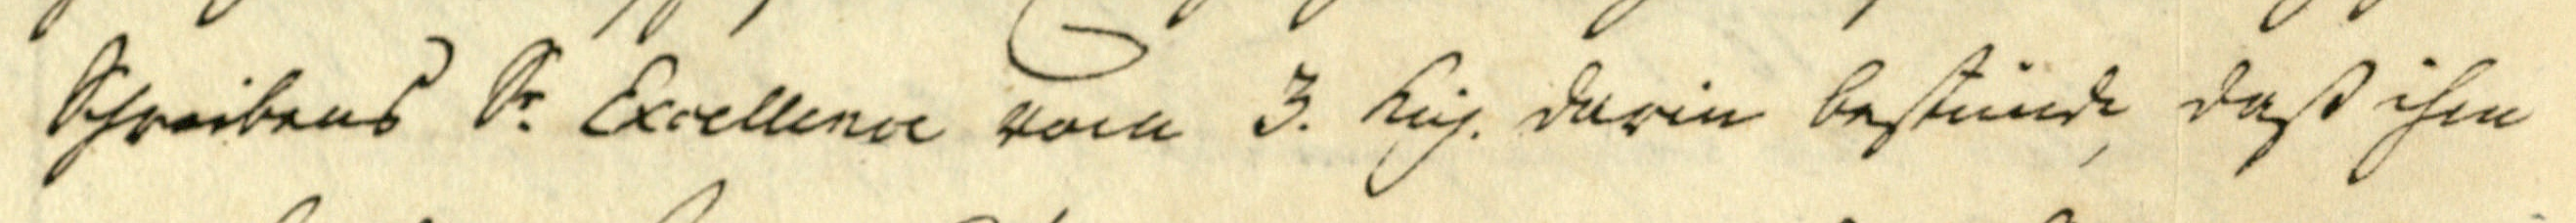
Schreibens Sr Excellence vom 3. huj. darin bestünde, daß ihm
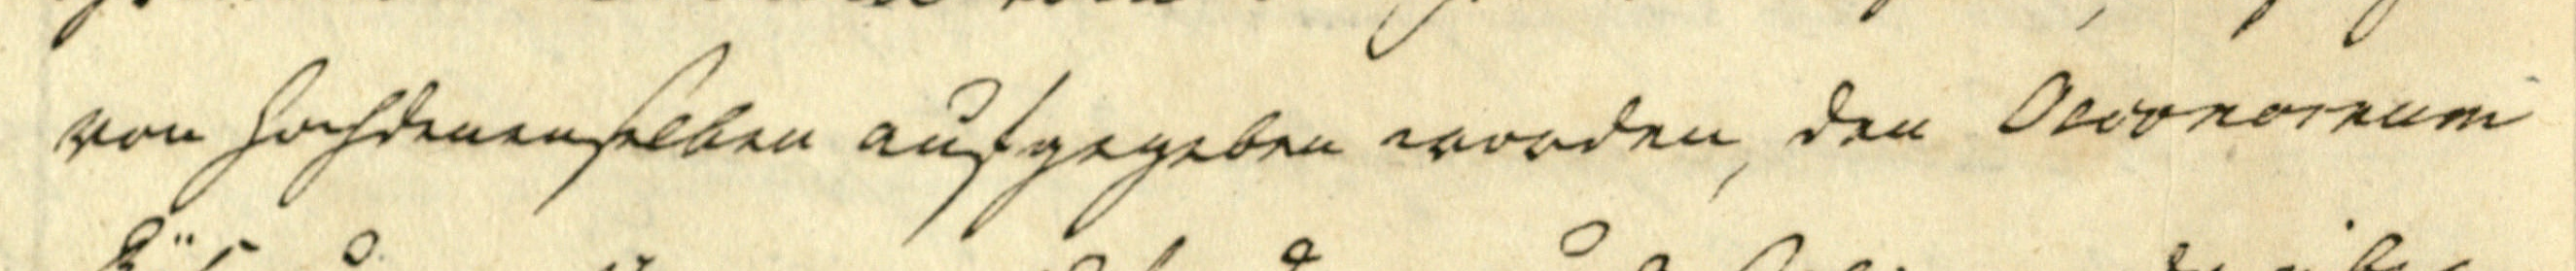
von Hochdenenselben aufgegeben worden, den Oeconomum
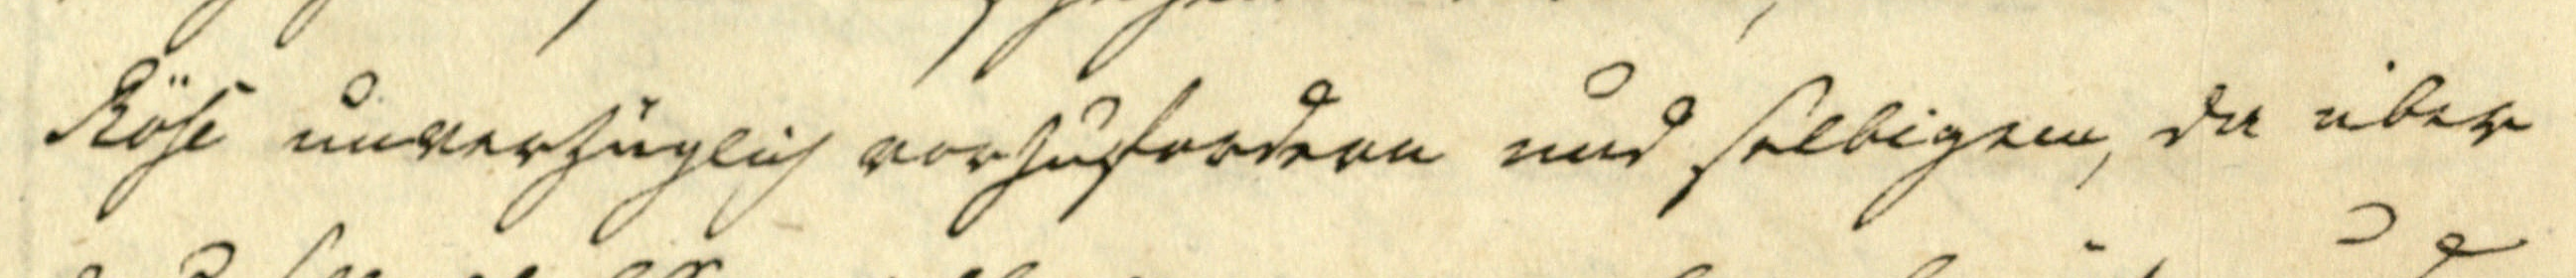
Röse unverzüglich vorzuforden und selbigem, da über
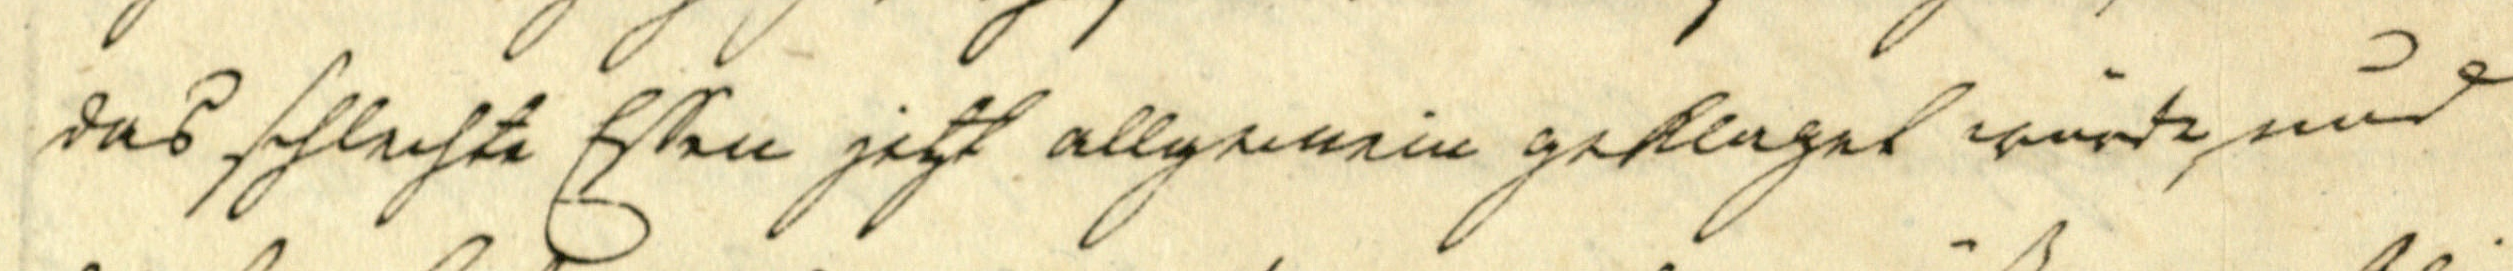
das schlechte Essen jetzt allgemein geklaget würde, und
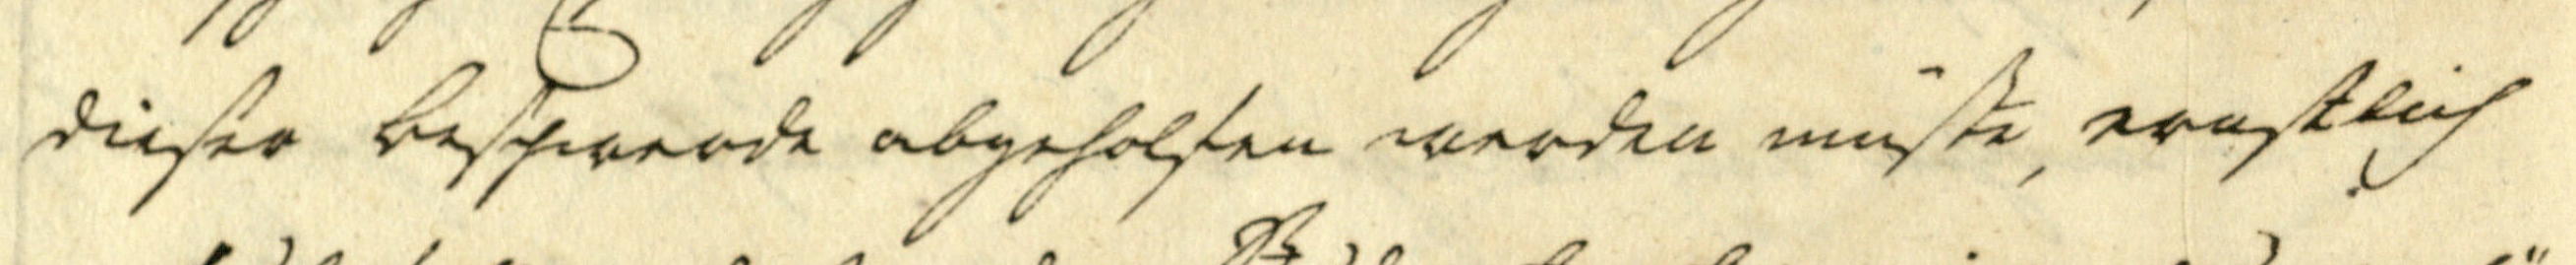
dieser Beschwerde abgeholfen werden müßte, ernstlich
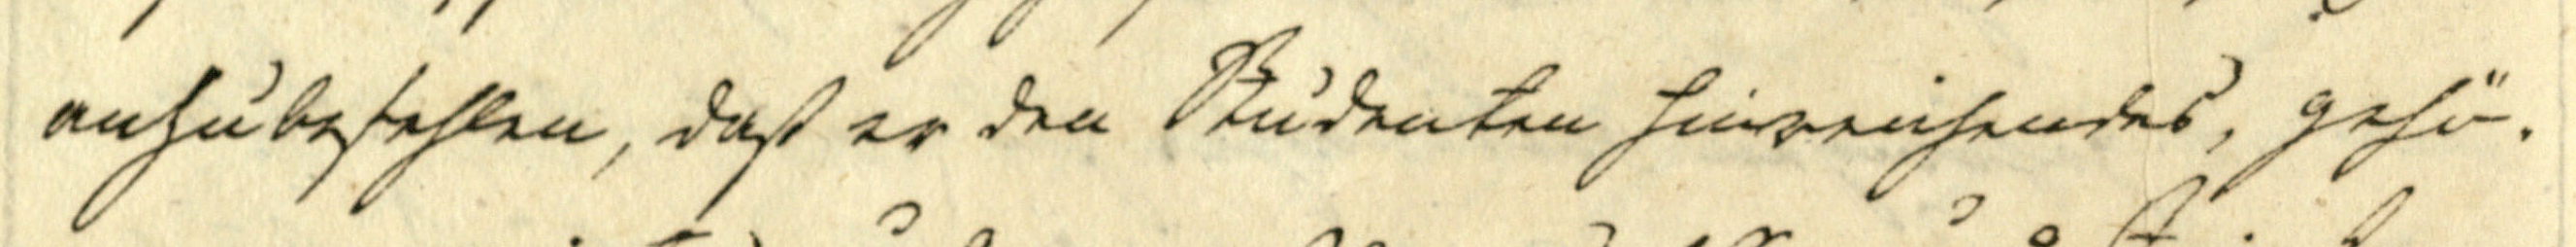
anzubefehlen, daß er den Studenten hinreichendes, gehö¬
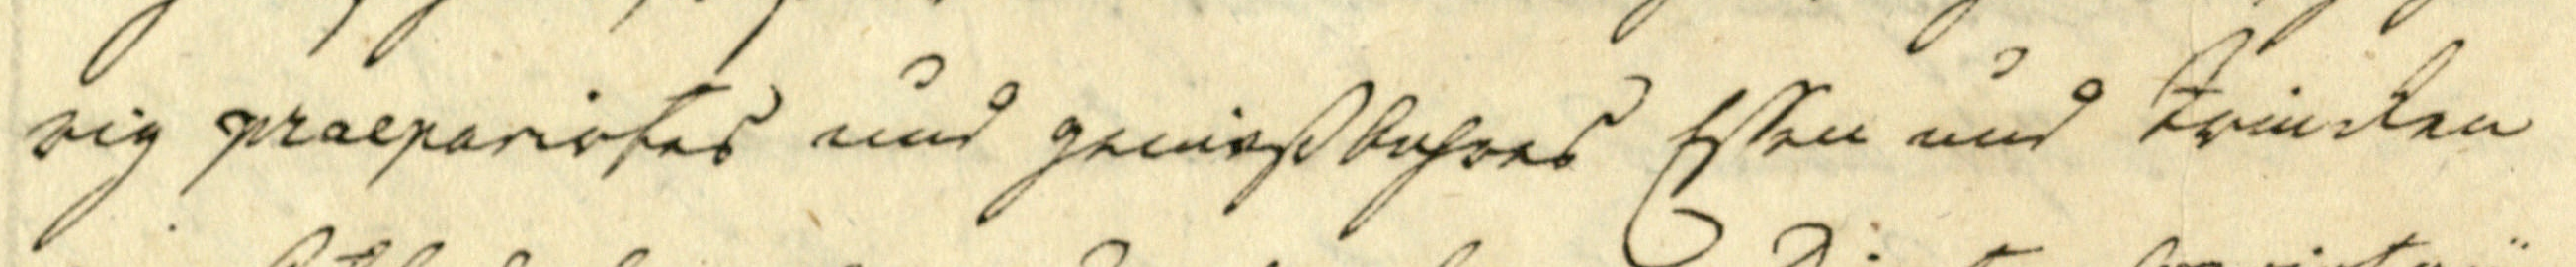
rig praeparirtes und genießbahres Essen und Trincken
